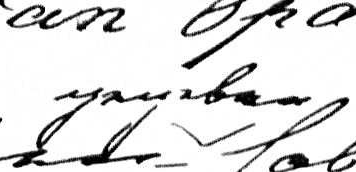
gegeben
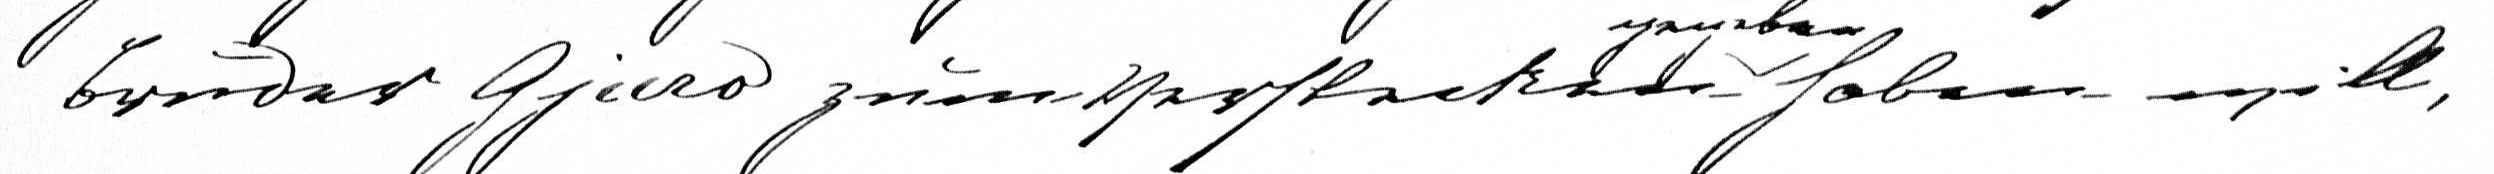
Bruder Gjuro zum Verstecken haben will,
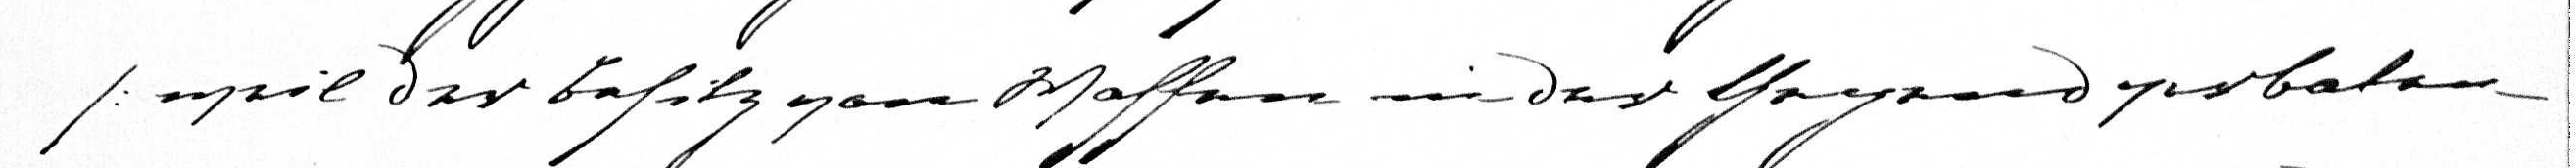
/: weil der Besitz von Waffen in der Gegend verbaten
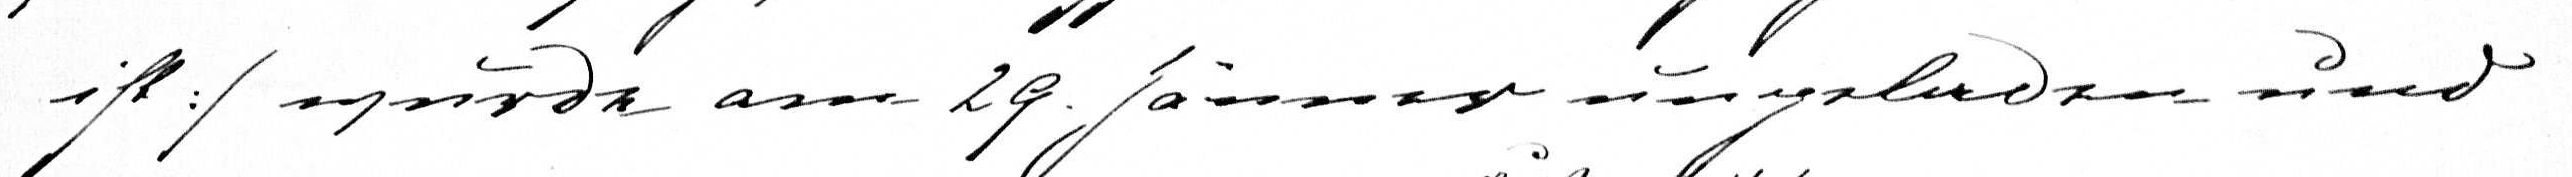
ist :/ wurde am 29. Jänner ungeladen und
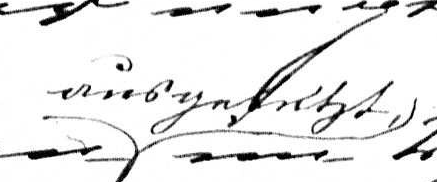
ausgesetzt
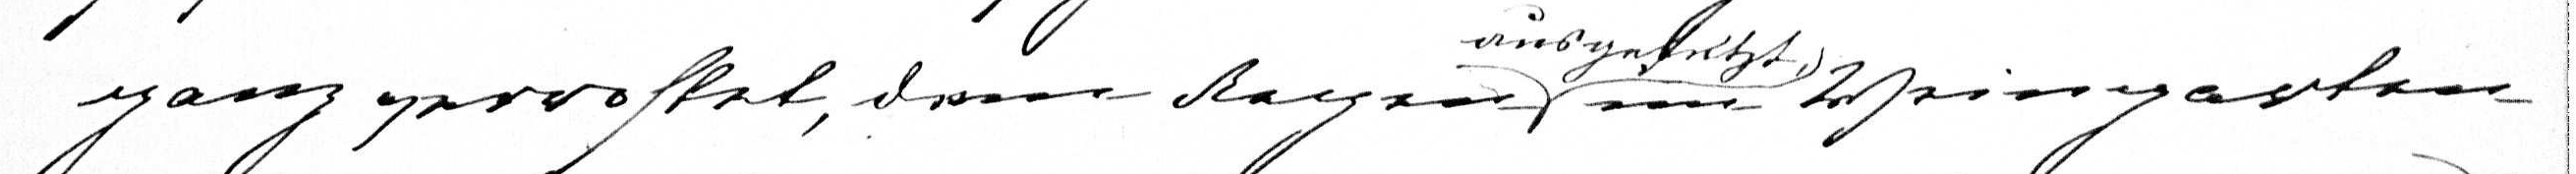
ganz verrostet, dem Regen im Weingarten
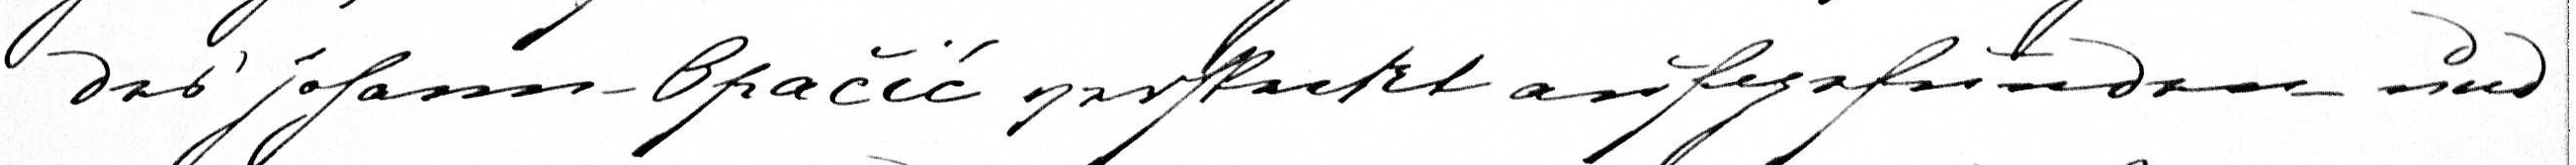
des Johann Opačić versteckt aufgefunden und
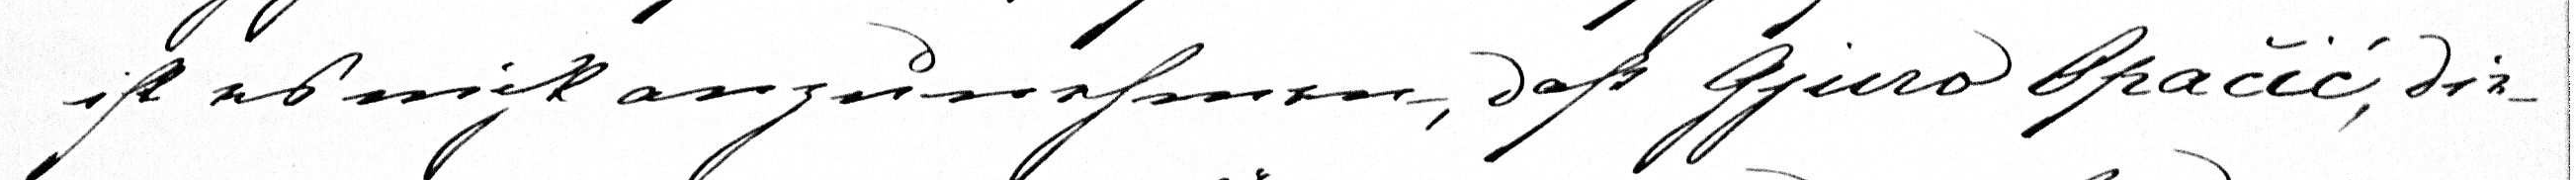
ist es nicht anzunehmen, daß Gjuro Opačić, die
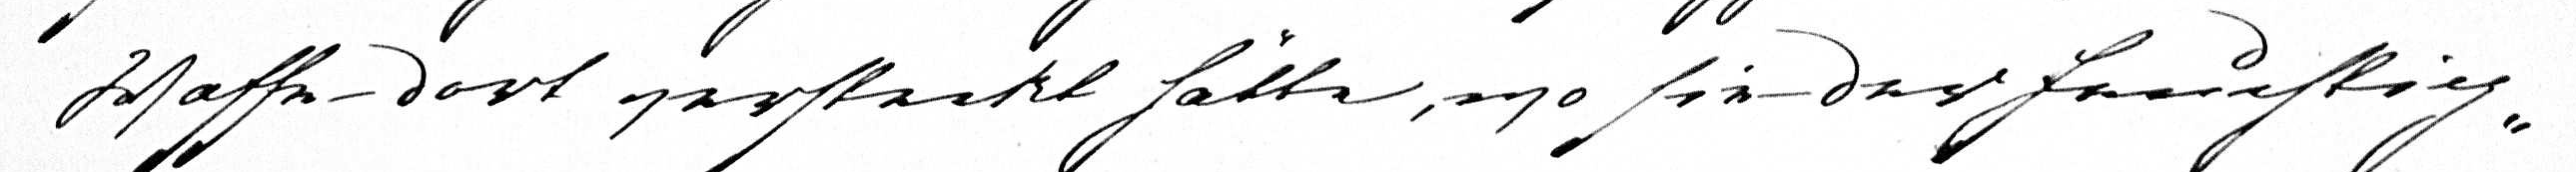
Waffe dort versteckt hätte, wo sie der Feuchtig¬
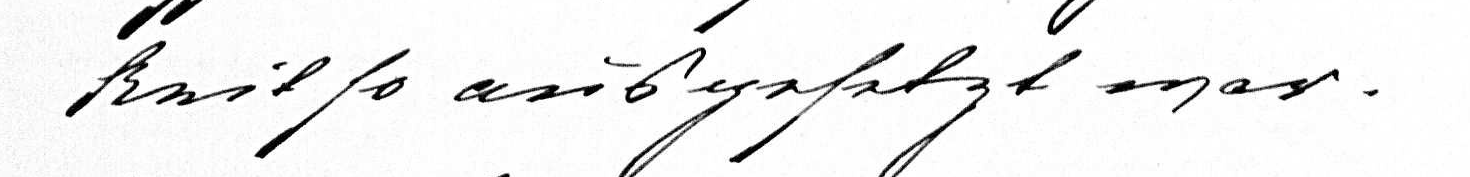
keit ausgesetzt war.
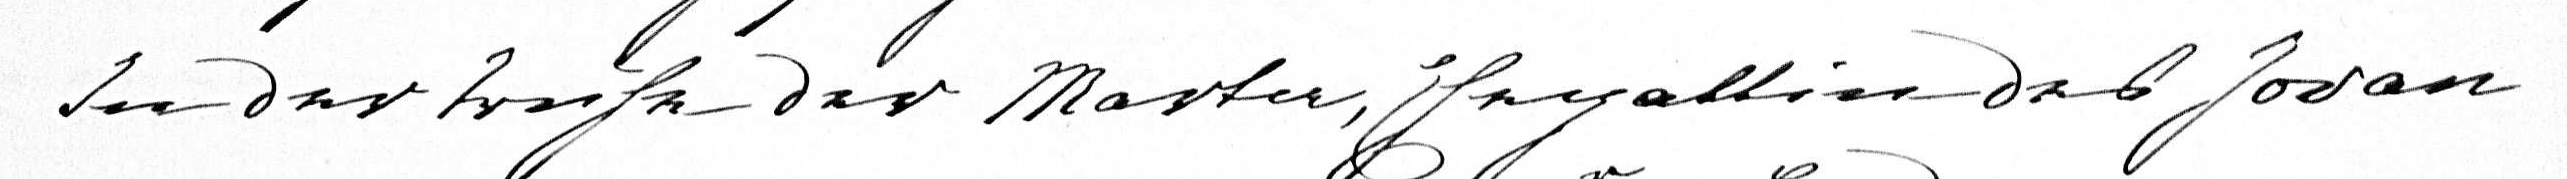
In der Treihe der Marter, Ehegattin des Jovan
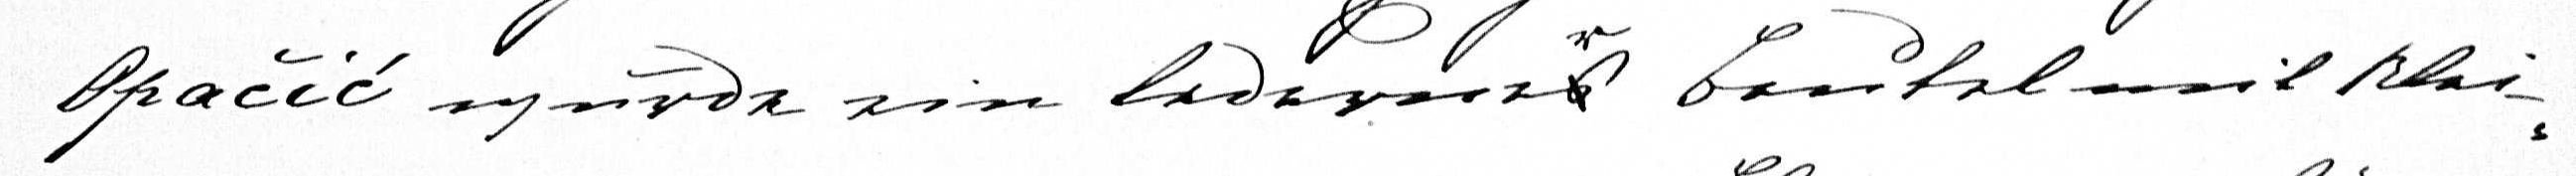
Opačić wurde ein lederner Beutel mit klei¬
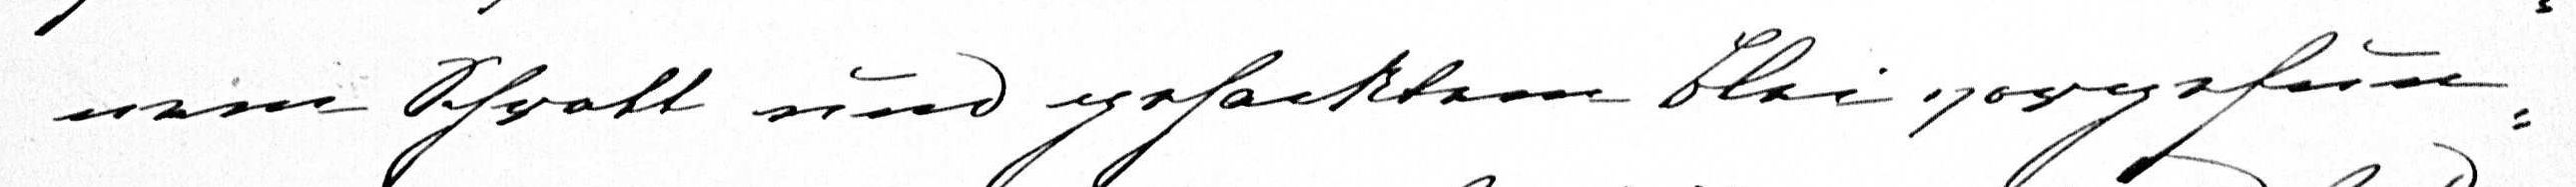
nem Schrott und gehacktem Blei vorgefun¬
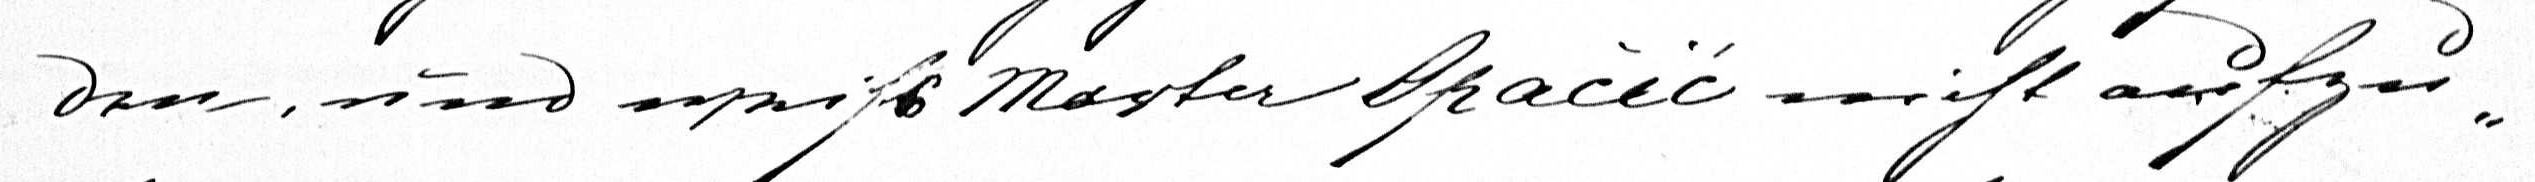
den, und weixx Marter Opačić nicht aufzu¬
